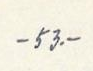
53
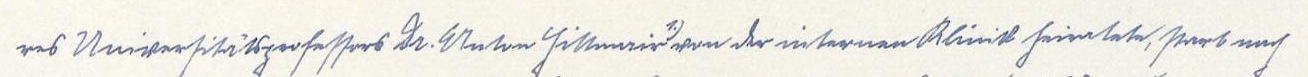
res Universitätsprofessors Dr. Anton Hittmair von der internen Klinik heiratete, starb nach
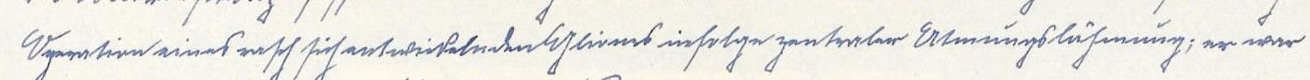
Operation eines rasch sich entwickelnden Glions infolge zu zentraler Atmungslähmung, er war
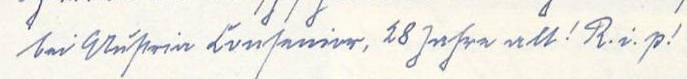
bei Austria Consenior, 28 Jahre alt! R.i.P!
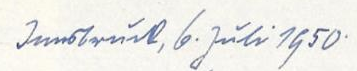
Innsbruck, 6. Juli 1950
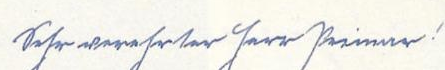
Sehr geehrter Herr Primar!
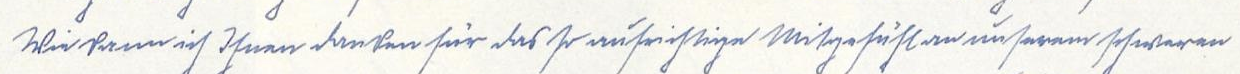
Wie kann ich Ihnen danken für das so aufrichtige Mitgefühl an unserem schweren
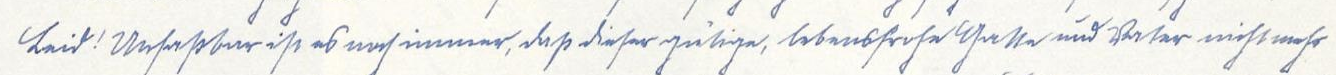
Leid! Unfassbar ist es noch immer, dass dieser gütige, lebensfrohe Gatte und Vater nicht mehr
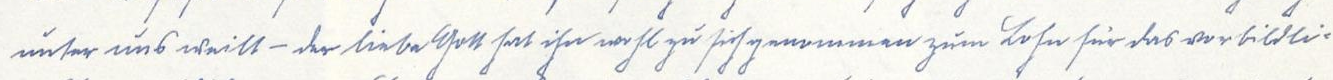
unter uns weilt - der liebe Gott hat ihn wohl zu sich genommen zum Lohn für das vorbildli-
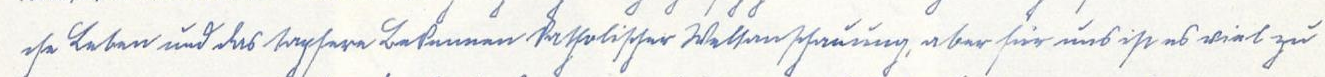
che Leben und des tapferen Bekennen katholischer Weltanschauung, aber für uns ist es viel zu
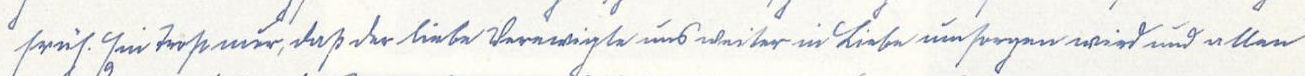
früh. Ein Trost nur, daß der liebe Verewigte uns weiter in Liebe umsorgen wird und allen
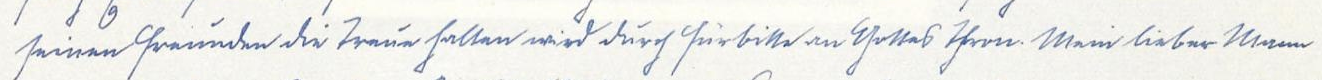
seinen Freunden die Treue halten wird durch Fürbitte an Gottes Thron. Mein lieber Mann
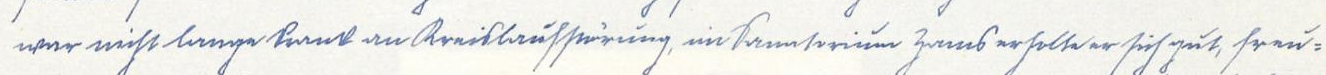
war nicht lange krank an Kreislaufstörung, im Sanatoriums Zams erholte er sich gut, freu-
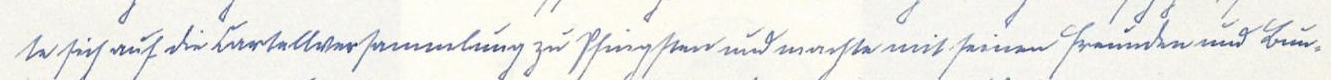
te sich auf die Cartellversammlung zu Pfingsten und machte mit seinen Freunden und Bun-
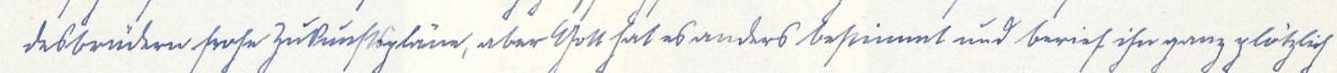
desbrüdern frohe Zukunftspläne, aber Gott hat anders bestimmt und berief ihn ganz plötzlich
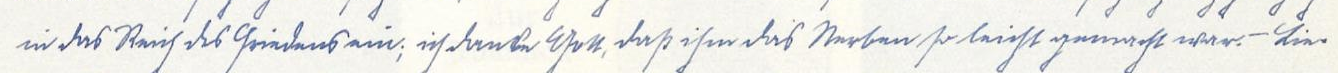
in das Reich des Friedens ein; ich danke Gott, dass ihm das Sterben so leicht gemacht war.- Lie-
